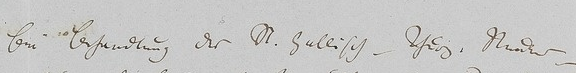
Bei Behandlung des St. Gallisch-Thurg. Steuer-
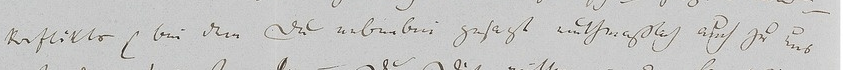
konflikts (bei dem Du nebenbei gesagt muthmaßlich auch zu uns
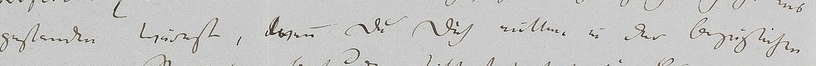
gestanden wärest, wenn Du Dich mitten in der bezüglichen
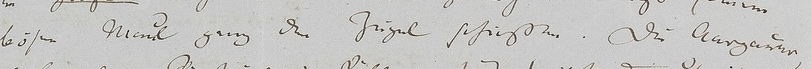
bösen Maul ganz den Zügel schießen. Die Aargauer,
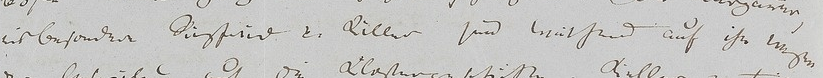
insbesondere Siegfried &. Keller sind wüthend auf ihn wegen
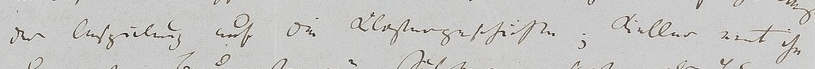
der Anspielung auf die Klostergeschichte; Keller nennt ihn
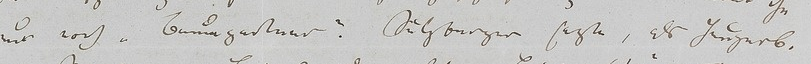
nur noch «Baumgartner». Sulzberger sagte, als Hungerb.
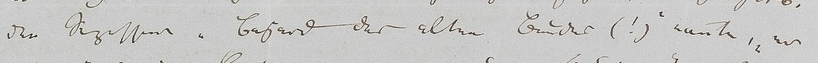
den Segesser «Bajard des alten Bundes (!)» nannte, «er
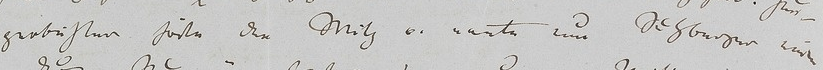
gerbühler hörte den Witz &. nannte nun Sulzberger einen
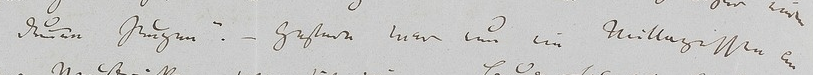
«dummen Jungen». – Gestern war nun ein Mittagessen in
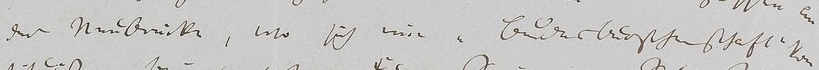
der Neubrücke, wo sich eine «Bundesburschenschaft» kon-
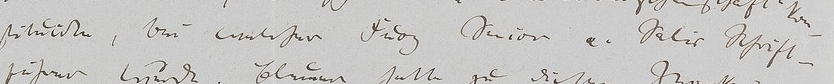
stituirte, bei welcher Fuog Senior &. Salis Schrift-
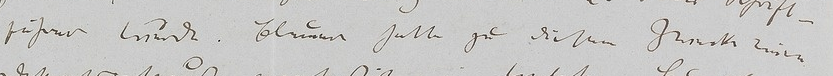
führer wurden. Blumer hatte zu diesem Zwecke einen
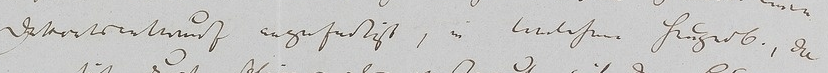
Dekretsentwurf angefertigt, in welchem Hungerb., da
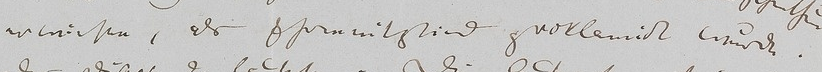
erwiesen, als Ehrenmitglied proklamirt wurde.
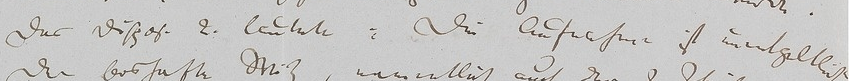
Das Dispos. 2. lautete: «Die Aufnahme ist unentgeltlich».
